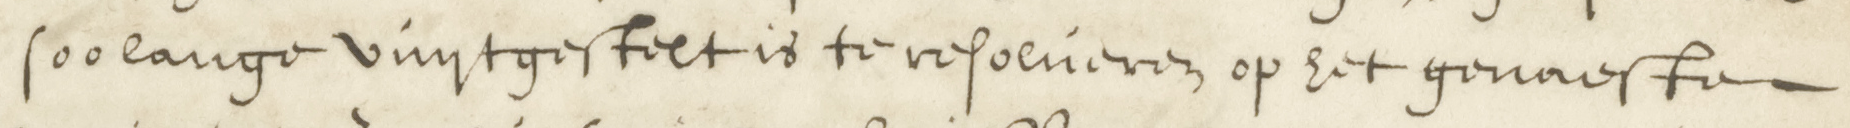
soo lange vuytgestelt is te resolueren op het genaeste
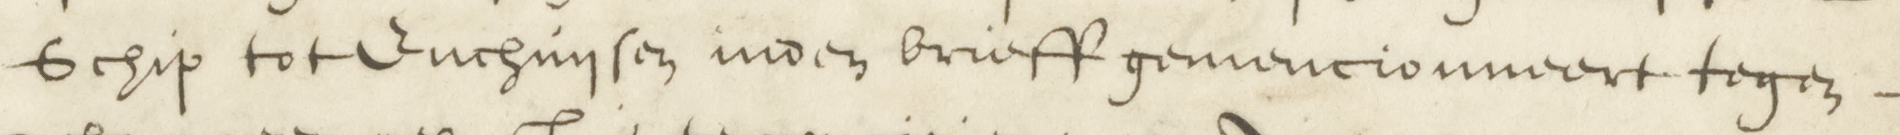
Schip tot Enchuysen inden brieff gemencionneert tegen -
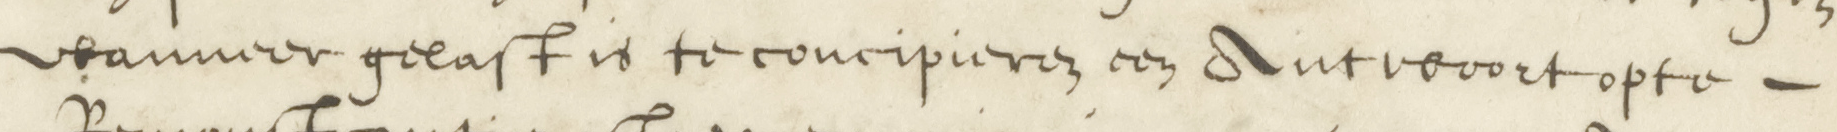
wanneer gelast is te concipieren een Antwoort opte —
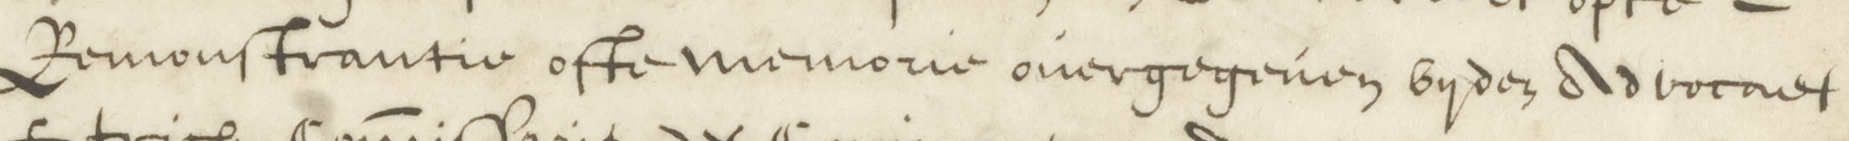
Remonstrantie ofte memorie ouergegeuen byden Advocaet
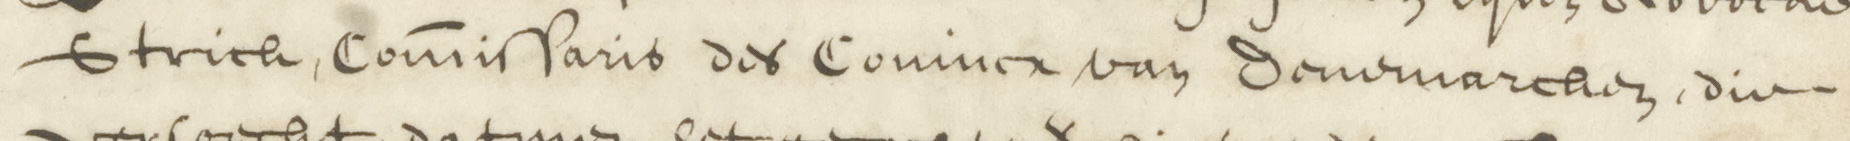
Strick, Comissaris des Conincx van Denemarcken, die
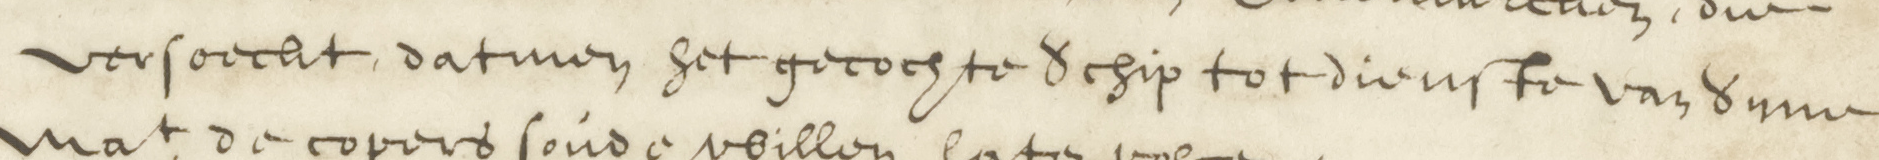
versoeckt, datmen het gecochte Schip tot dienste van Syne
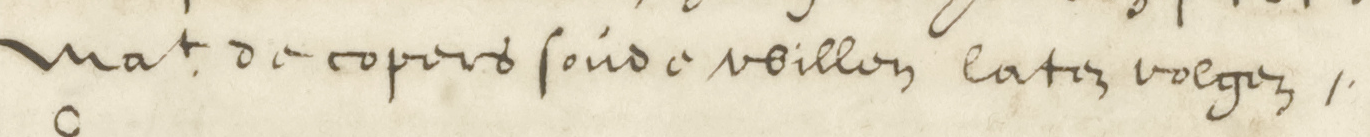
Mat. de copers soude willen laten volgen.
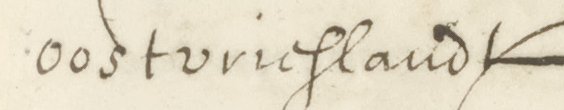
oostvrieslandt
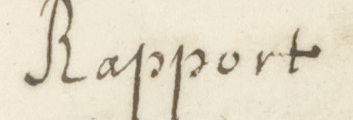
Rapport
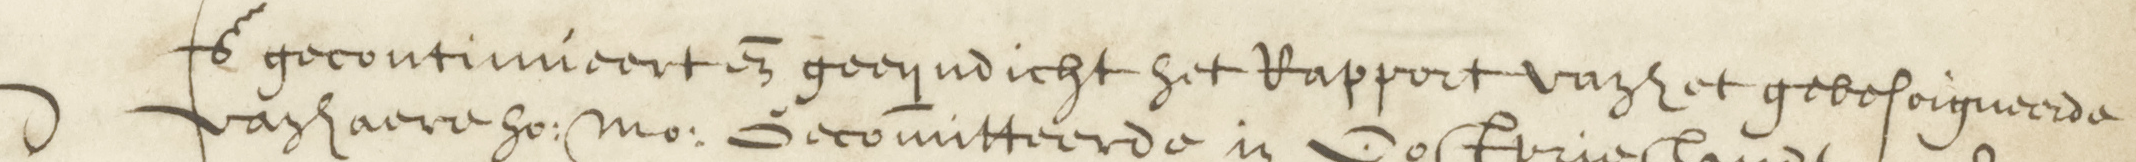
Is gecontinueert en geeyndicht het Rapport van het gebesoigneerde
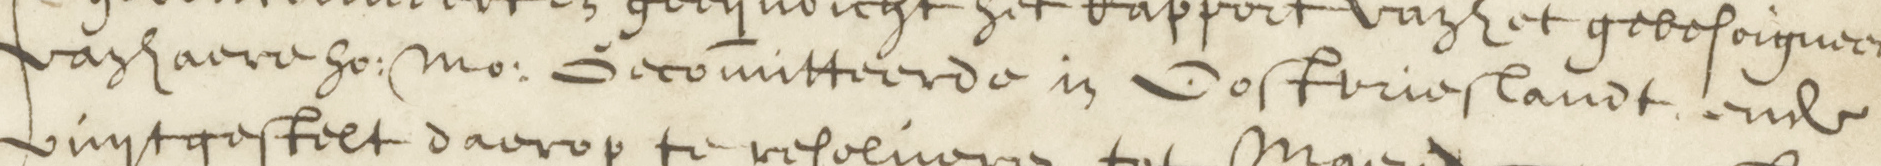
van haere ho:Mo: Gecomitteerde in Oostvrieslandt, ende
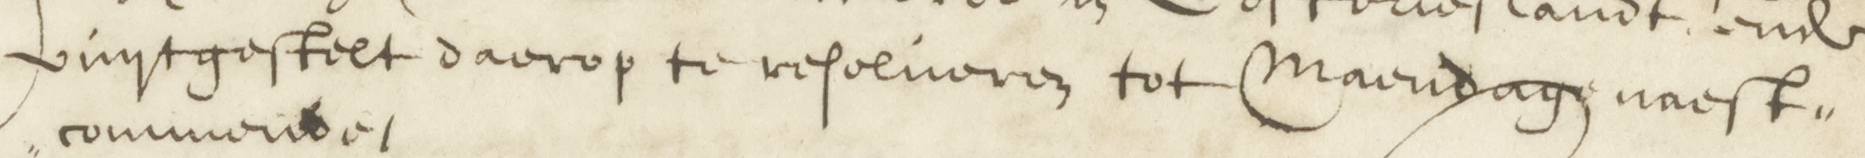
vuytgestelt daerop te resolueren tot Maendage naest„
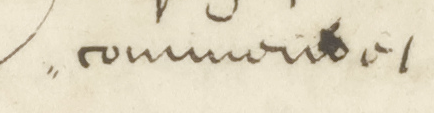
„commende.
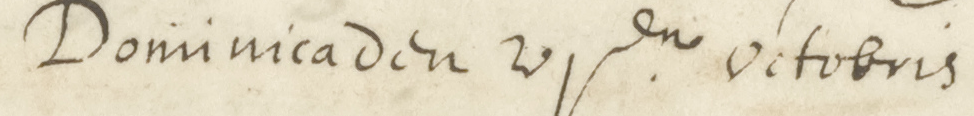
Dominica den vjen. octobris
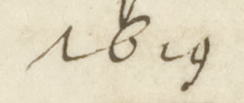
1619
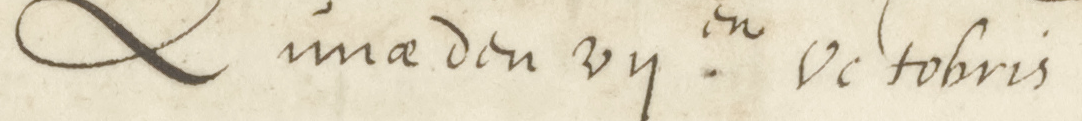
Luna den vijen. octobris
